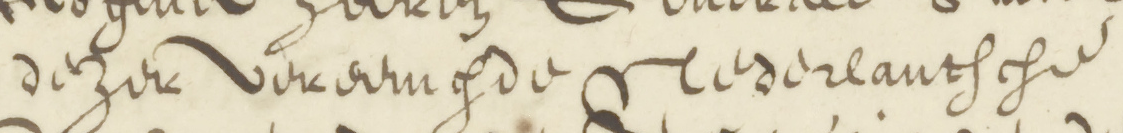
dezer vereenichde Nederlantsche
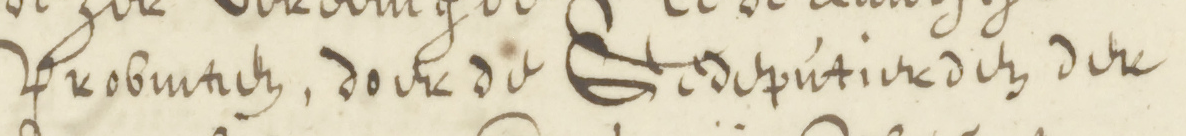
provintien, doer de Gedeputierden der
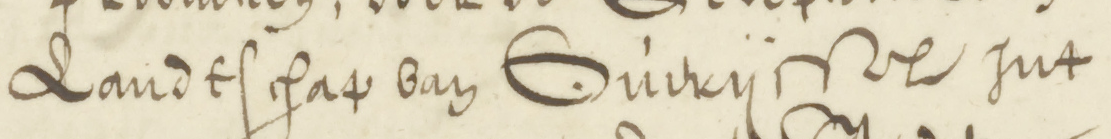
Landtschap van Oueryssel int
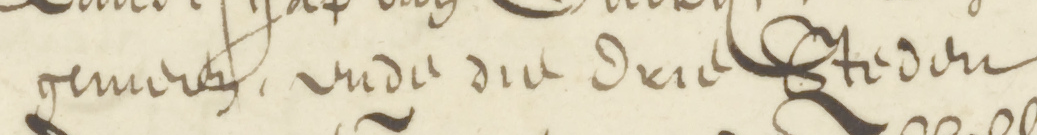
gemeen, ende die drie steden
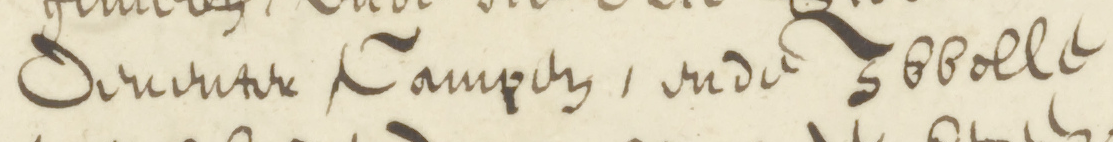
Deventer, Campen, ende Zwolle
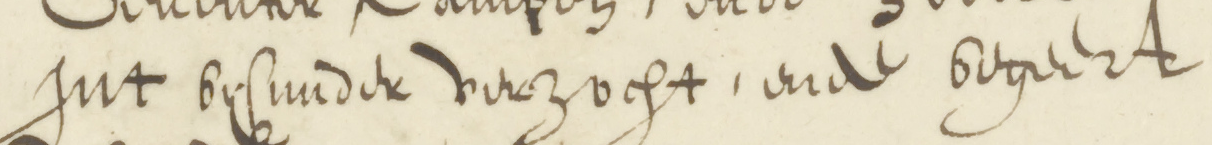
int bysunder verzocht, ende begeert
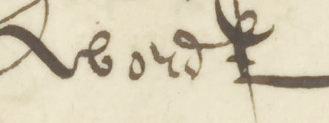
wordt
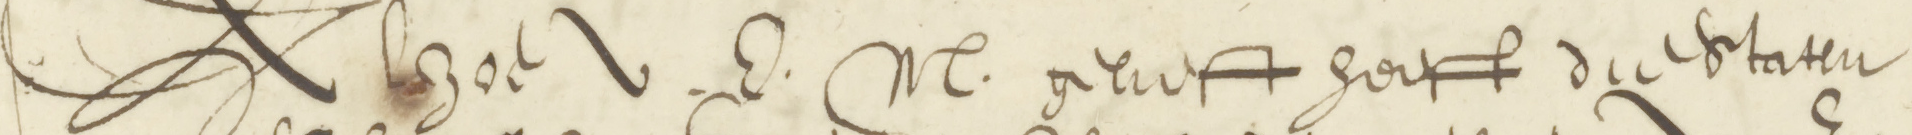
Alzoe U. E. M. gelieft heeft die Staten
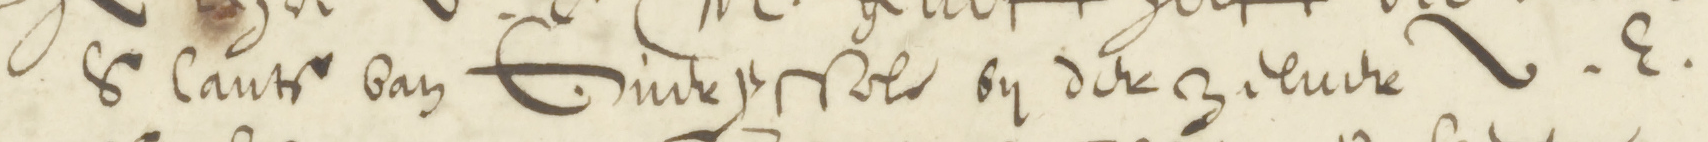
S lants van Oueryssel by der zeluer U. E.
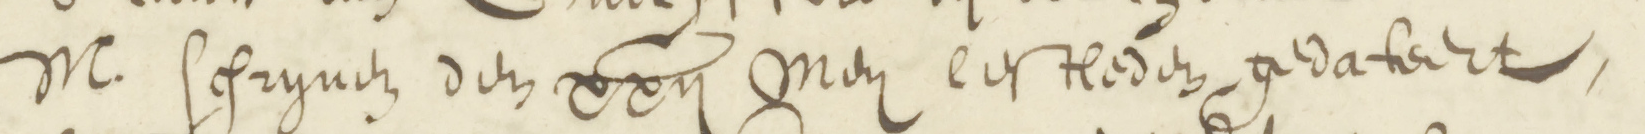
M. schryuen den xxij Mey lestleden gedateert,
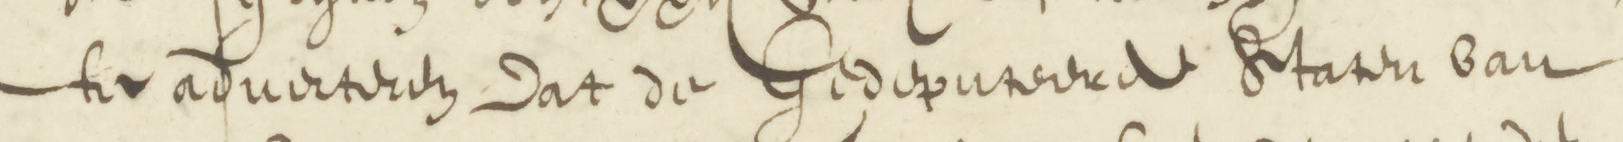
te aduerteren dat de Gedeputeerde Staten van
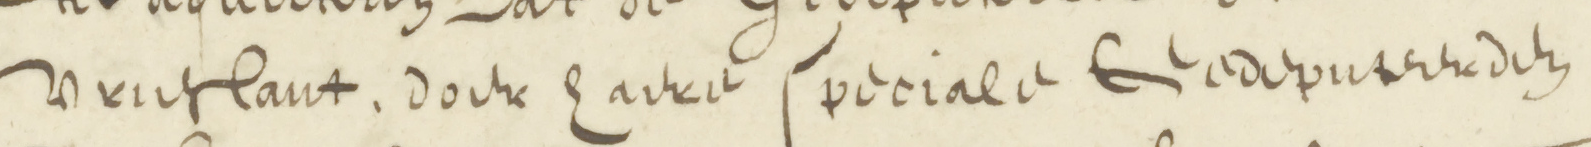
Vrieslant, doer haere speciale Gedeputeerden
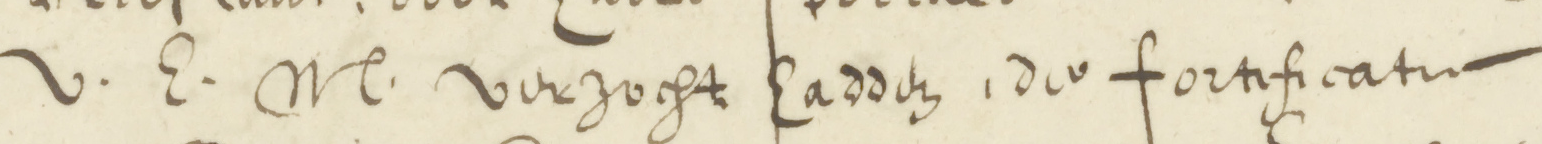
U. E. M. verzocht hadden, de fortificatie
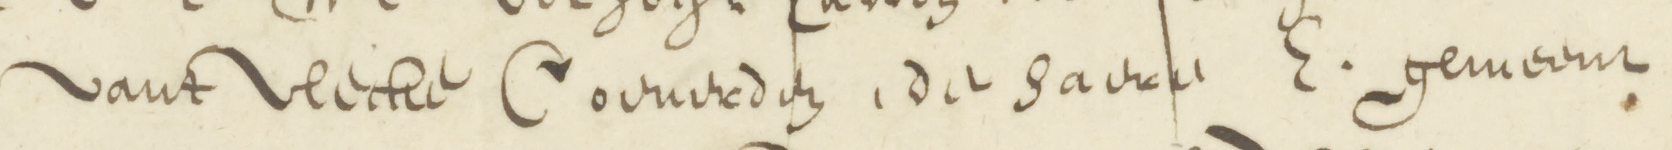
vant vlecke Coeverden, die haere E. gemeent
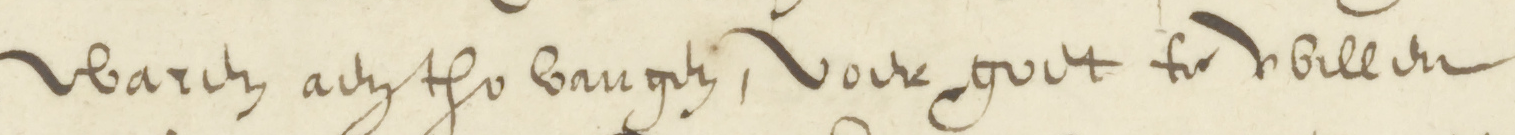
waren aentho vangen, voer goet te willen
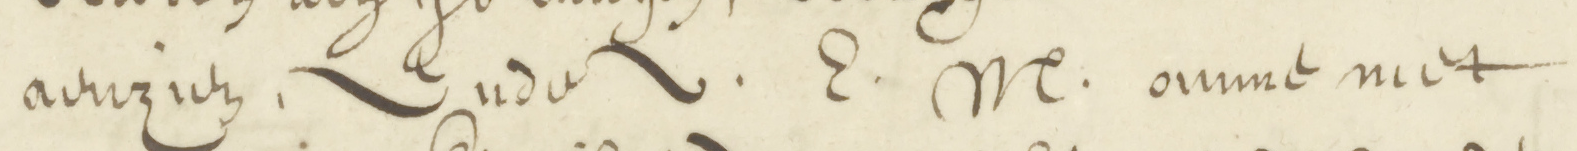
aenzien, ende U. E. M. omme met
